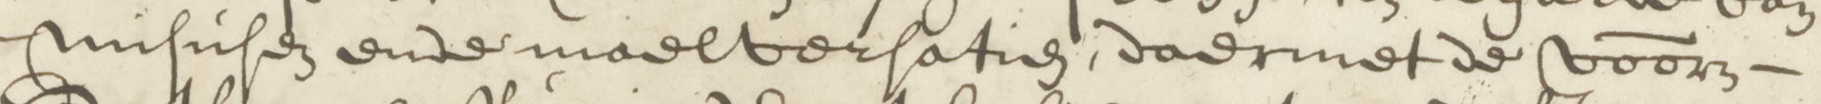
misusen ende maelversatien, daermet de voorn —
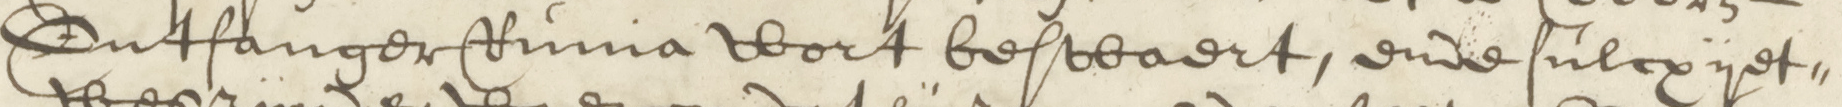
Ontfanger Runia wort beswaert, ende sulcx ijet„
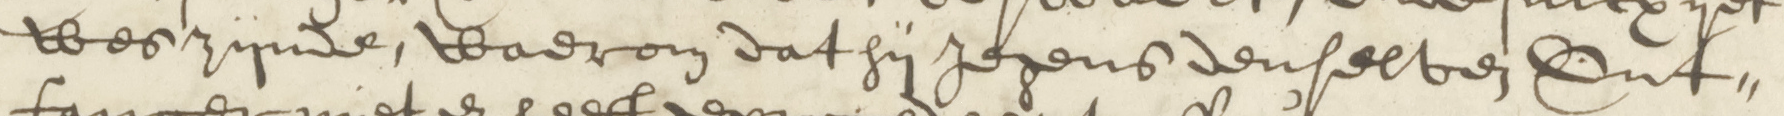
wes zijnde, waerom dat hij Jegens denselven Ont„
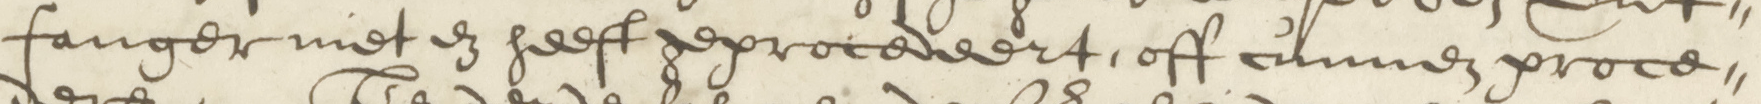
fanger niet en heeft geprocedeert, off cunnen proce„
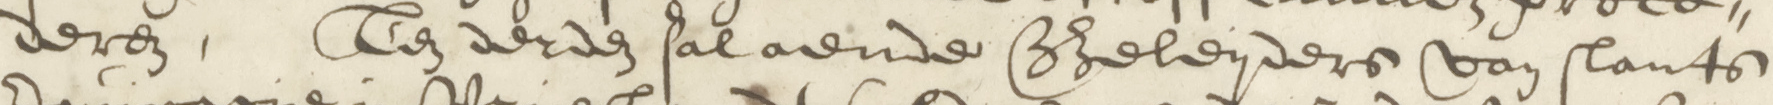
deren. Ten derden sal aende Beleijders van slants
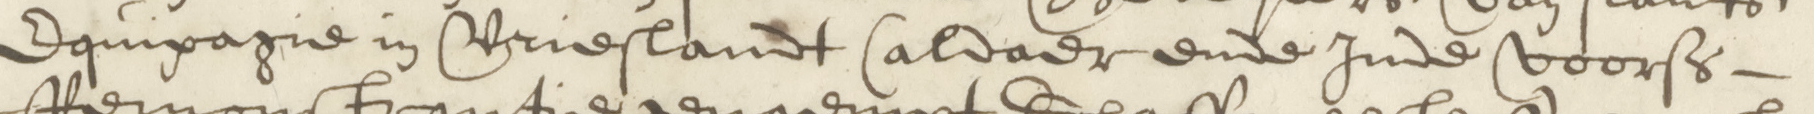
Equipagie in Vrieslandt (aldaer ende Inde voorsz —
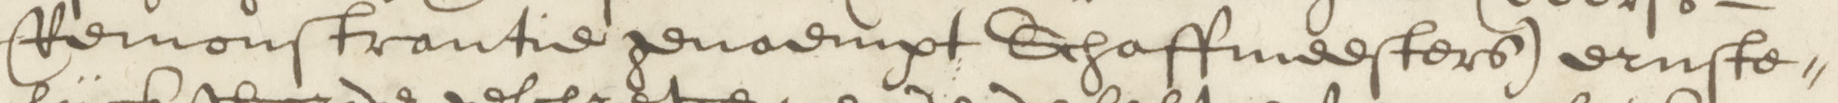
Remonstrantie genaempt Schaffmeesters) ernste„
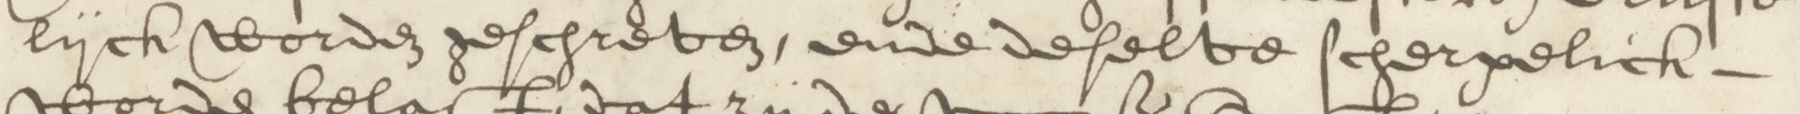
lijck worden geschreven, ende deselve scherpelick —
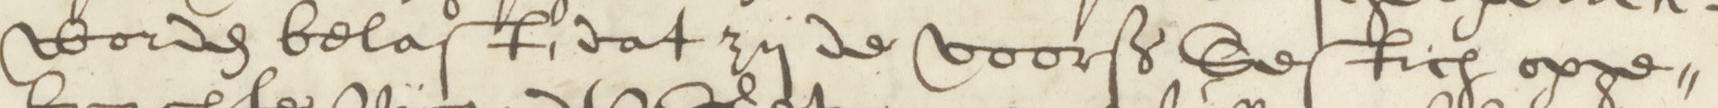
worden belast, dat zij de voorsz Sestich opge„
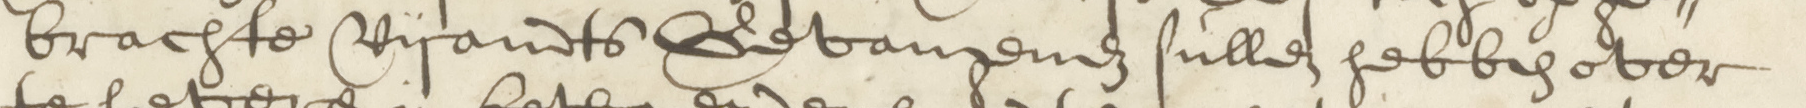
brachte vijandts Gevangenen sullen hebben over
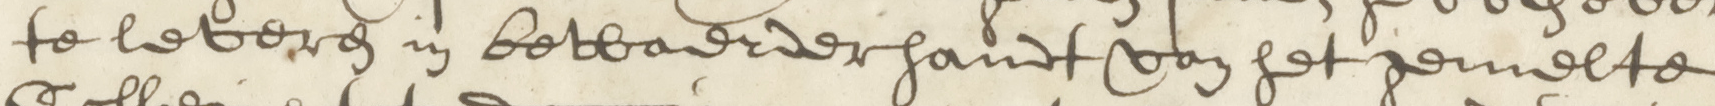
te leveren in bewaerderhant van het gemelte
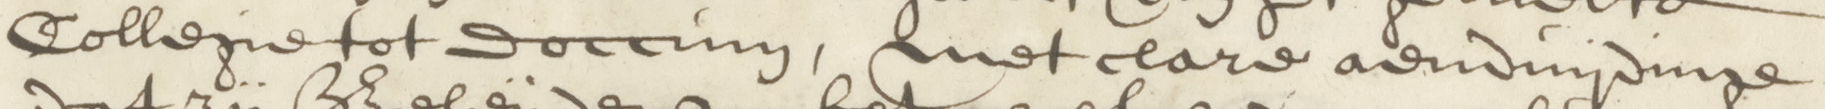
Collegie tot doccum, met clare aenduijdinge
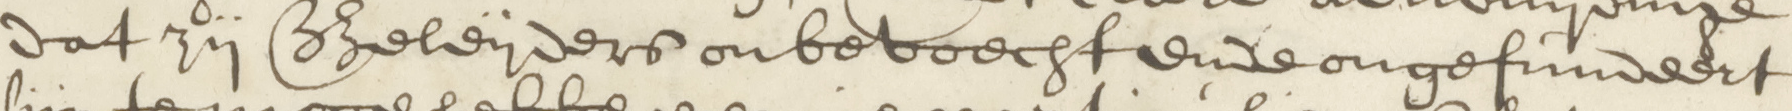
dat zij Beleijders onbevoecht ende ongefundeert
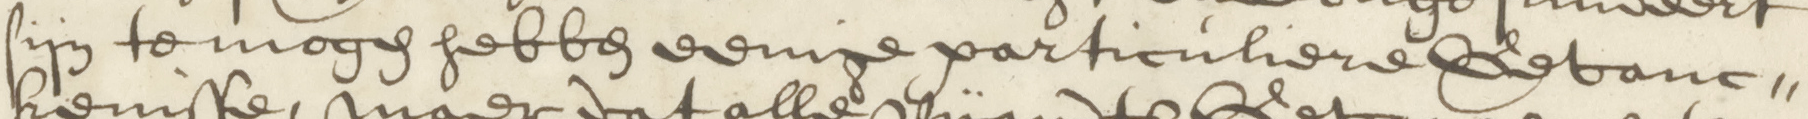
sijn te mogen hebben eenige particuliere Gevanc„
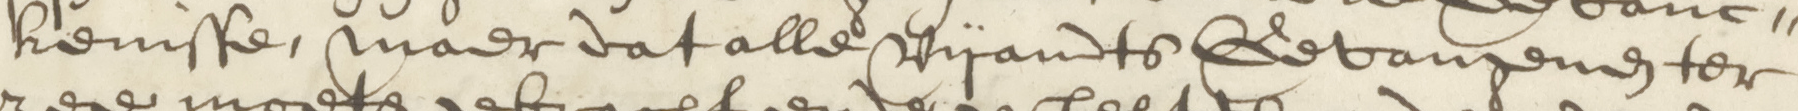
kenisse, maer dat alle vijandts Gevangenen ter
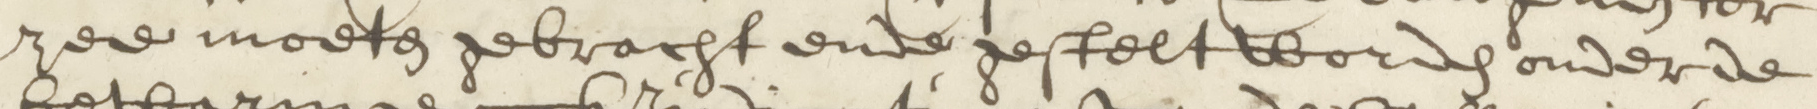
zee moeten gebracht ende gestelt worden onder de
